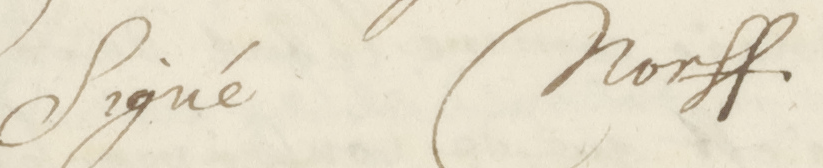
Signe Norff
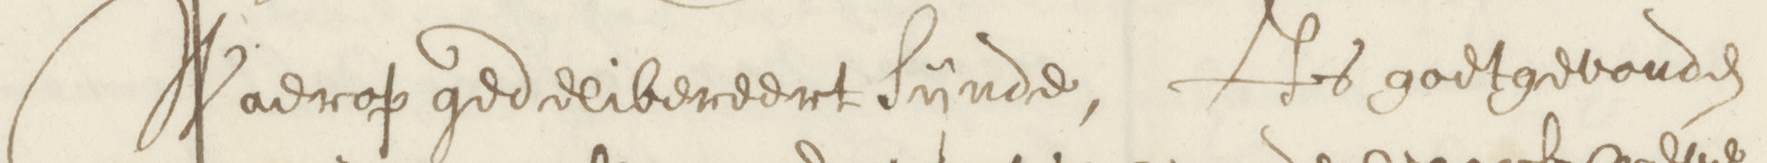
Waerop gedelibereert sijnde, Is goetgevonden
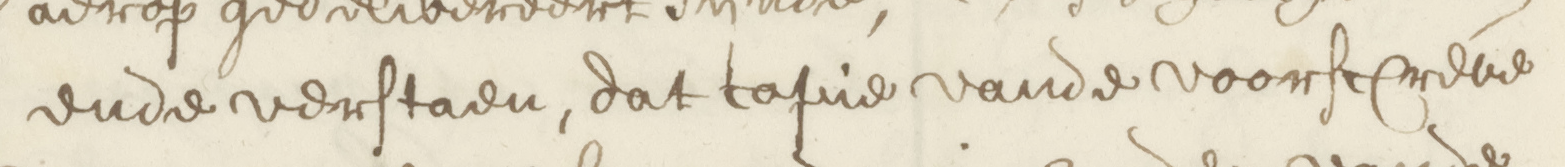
ende verstaen, dat copie vande voorschreve
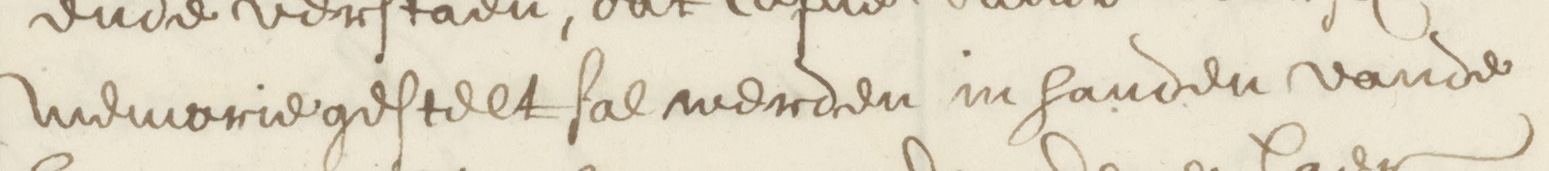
memorie gestelt sal werden in handen vande
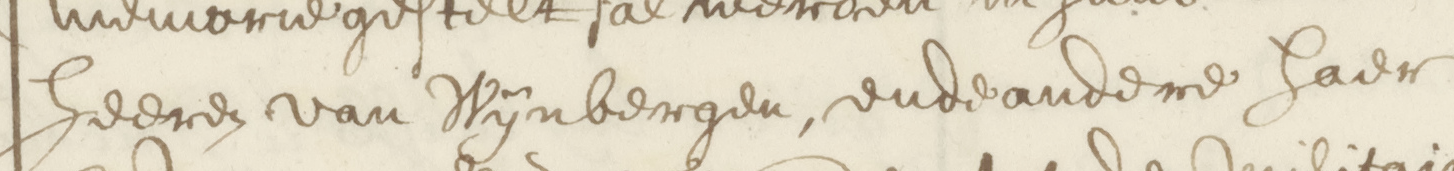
heeren van Wijnbergen, ende andere haer
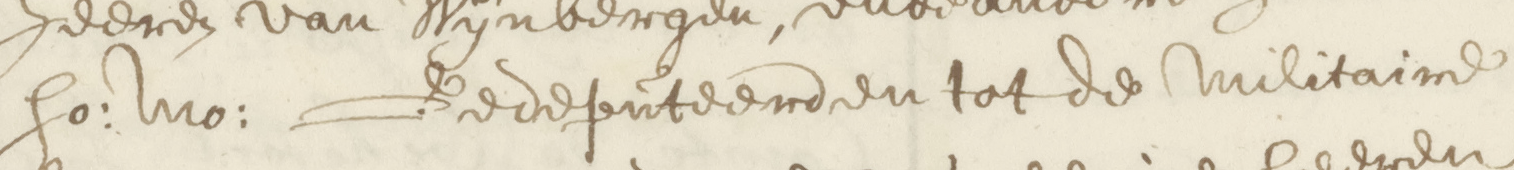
ho:mo: Gedeputeerden tot de militaire
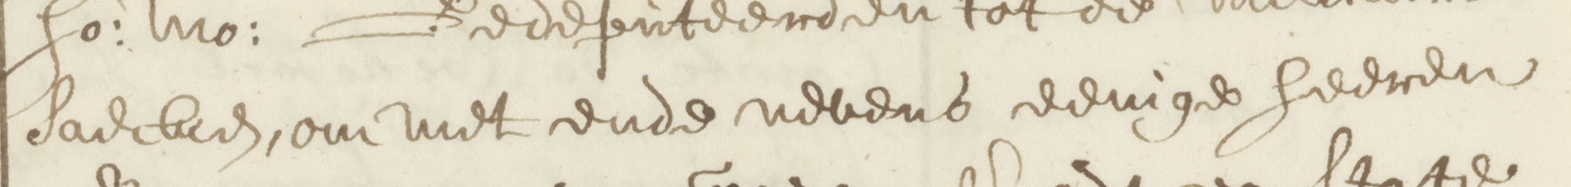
saecken, om met ende nevens eenige heeren
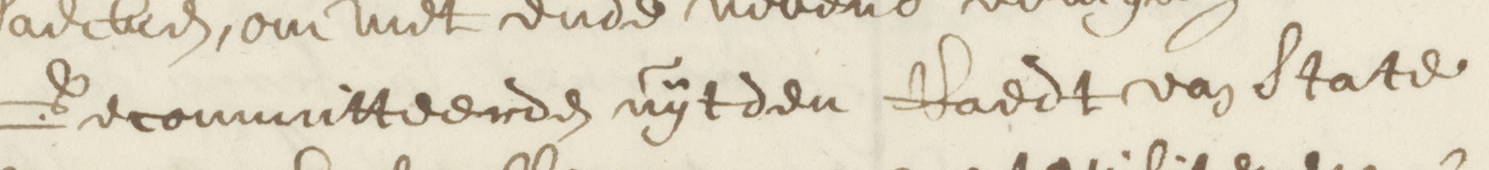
Gecommitteerden uijt den Raedt van State
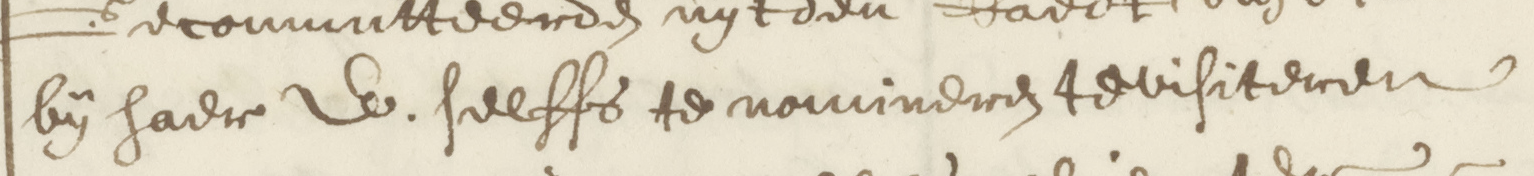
bij haer E. selffs te nomineren te visiteren
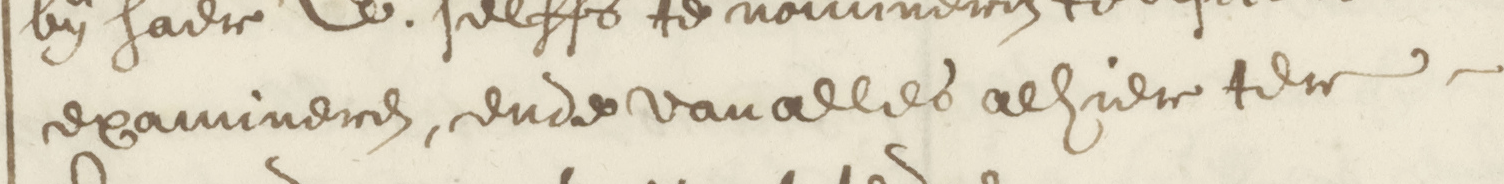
examineren, ende vanalles alhier ter
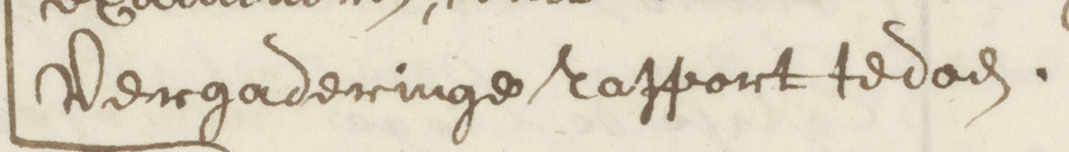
Vergaderinge rapport te doen.
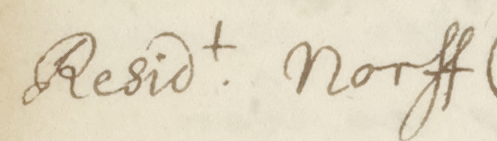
Residt. Norff
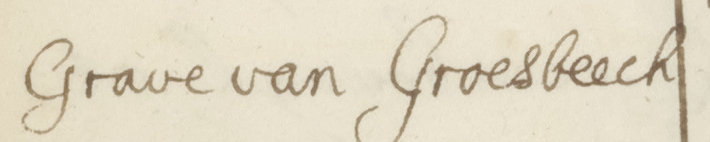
Grave van Groesbeeck
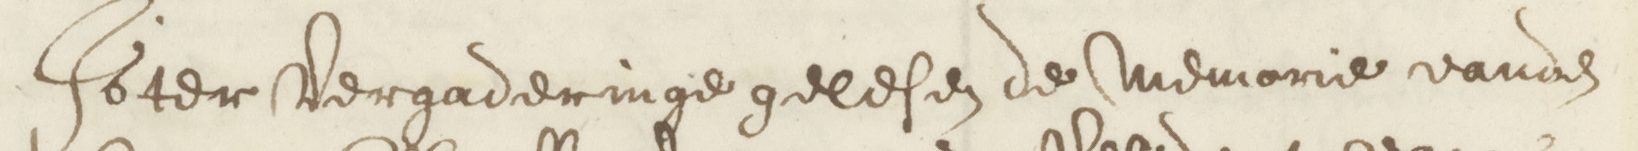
Is ter vergaderinge gelesen de memorie vanden
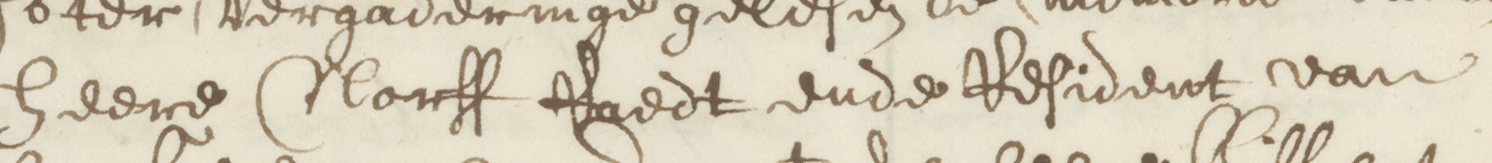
heere Norff Raedt ende Resident van
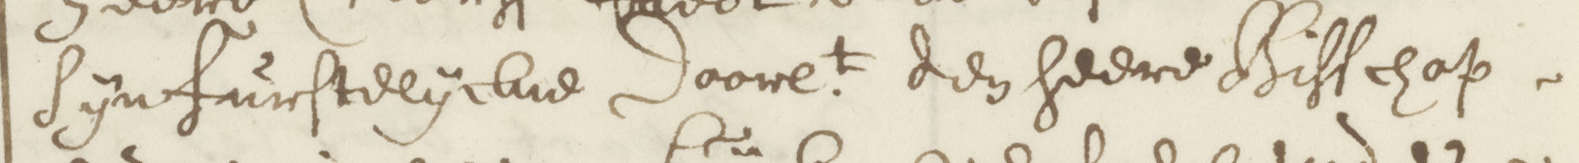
sijn furstelijcke Doorlt. den heere Bisschop-
